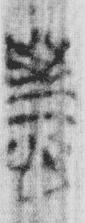○（偽）
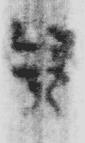凡
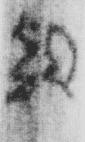交
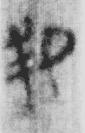母
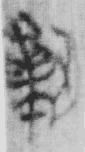剌（烈）
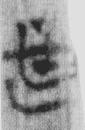必
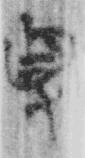史（使）
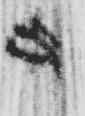又（有）
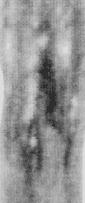末
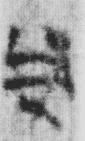凡
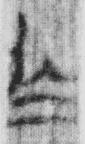於
